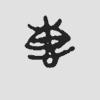惠
